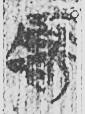{口甹}
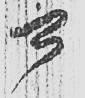乃
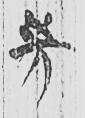先
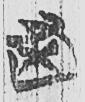建
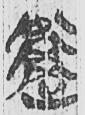{衛止}
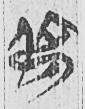弔
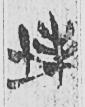{土丰}
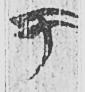于
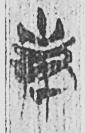庚
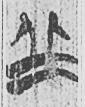丘
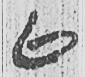㠯（以）
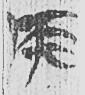侯
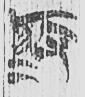殷
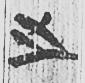之
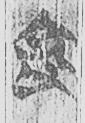{余又}
